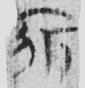所
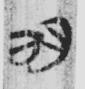明
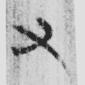又
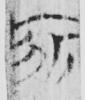所
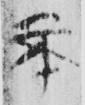不
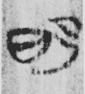明
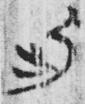此
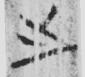之
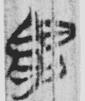{胃刀}（謂）
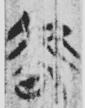○（乎）
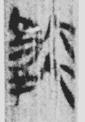○（融）
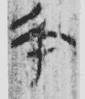○（師）
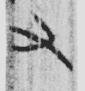又
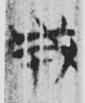成
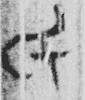氏（是）
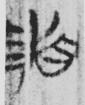{爿首}（狀）
